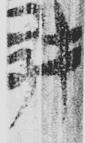邦
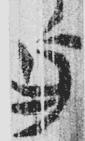此
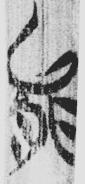能
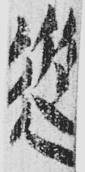從
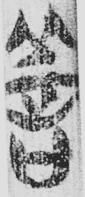善
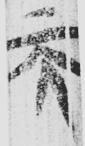而
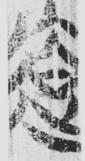迲（去）
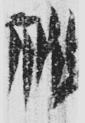○（過）
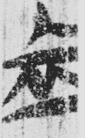者
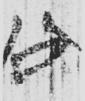公
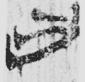曰
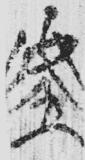○（吾）
